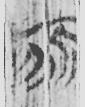所
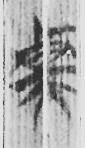{真天}（祗）
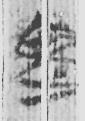畏
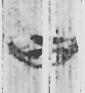曰
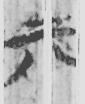亓
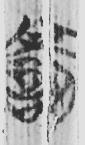罰
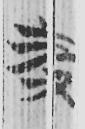寺
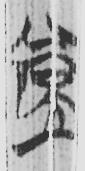當
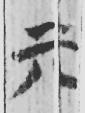亓
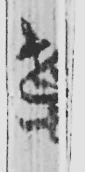惪
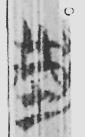型
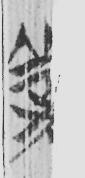義
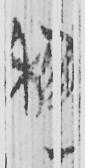利
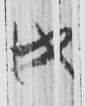女
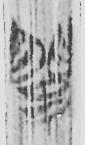{門串}（關）
